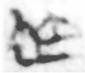笀
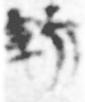斬
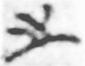之
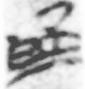爲
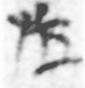○（左）
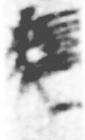驂
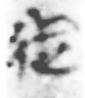迅
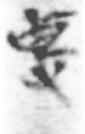弁
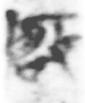啟
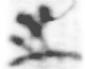之
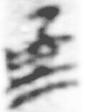爲
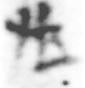○（左）
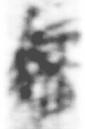○（服）
